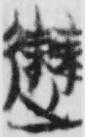速
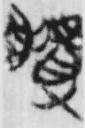○（瘥）
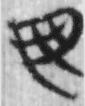母
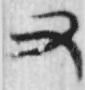又（有）
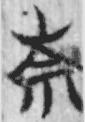柰
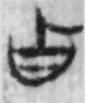占
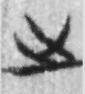之
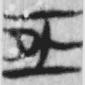亙（月？）
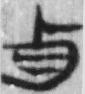貞
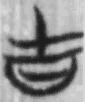吉
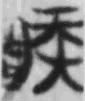疾
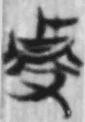弁（變）
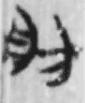○（病）
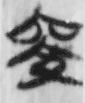窔
